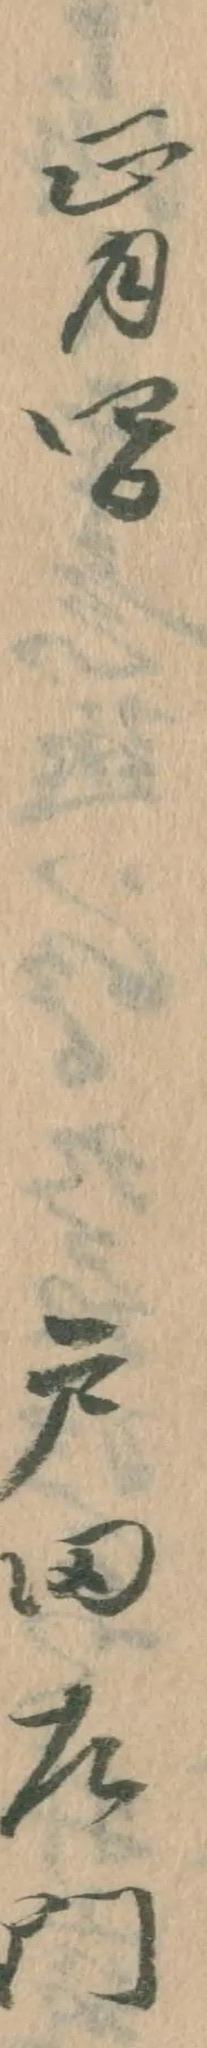正月四日戸田左門
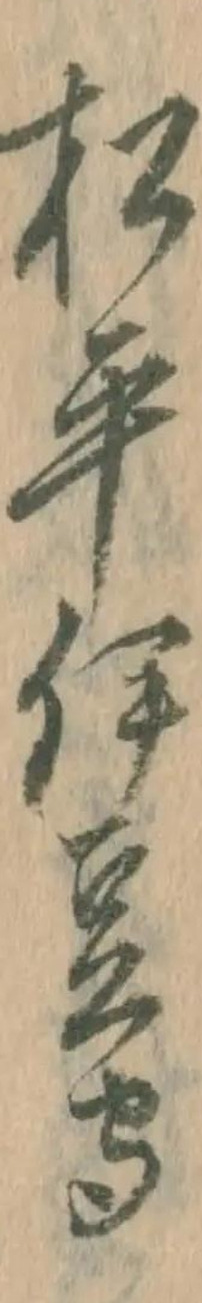松平伊豆守
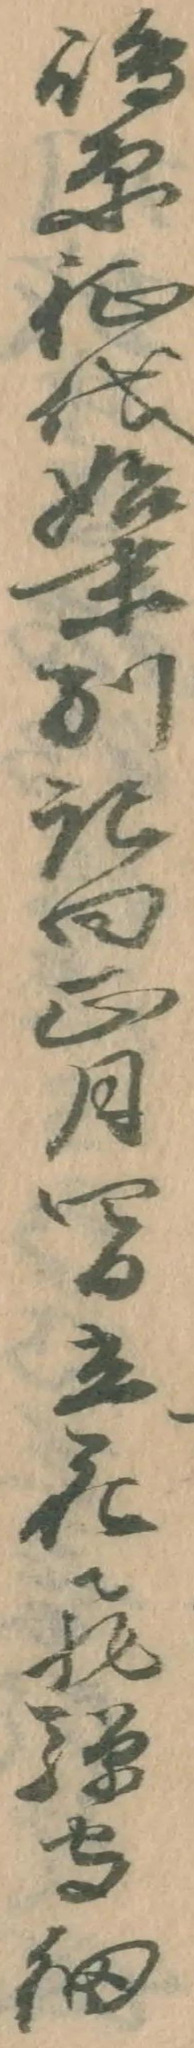島原征伐始末別記曰正月四日立花飛騨守細

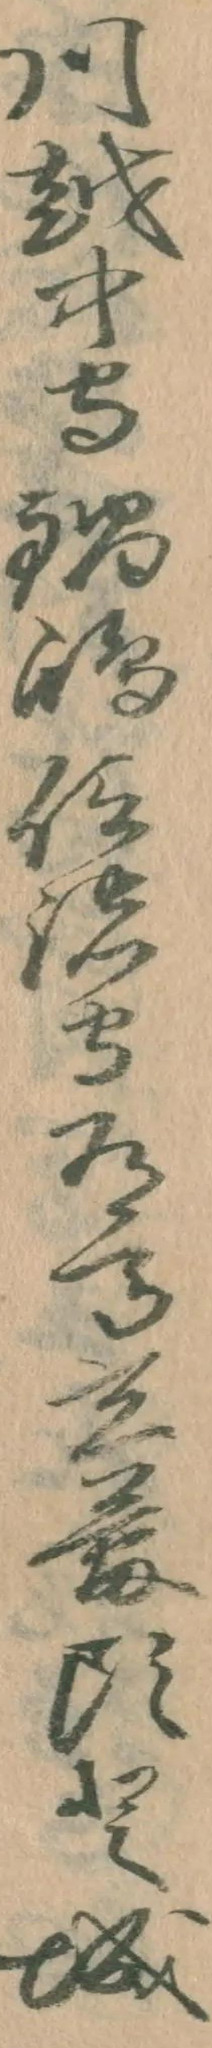川越中守鍋島信濃守有馬玄蕃頭登城
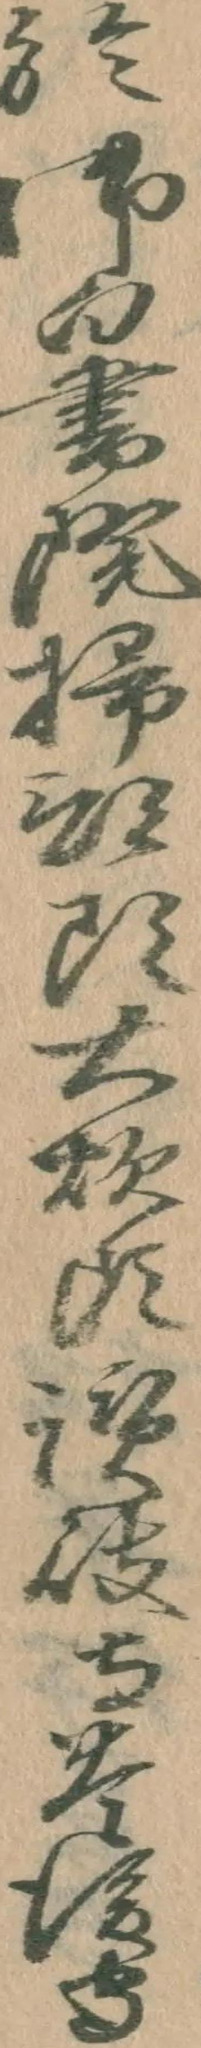於御白書院掃部頭大炊頭讃岐守豊後守
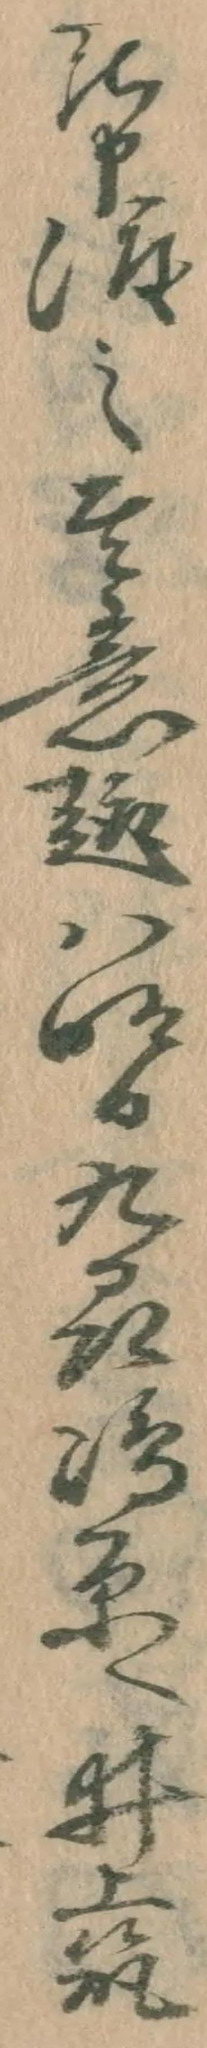被申渡之其意趣は明日九州島原へ井上築
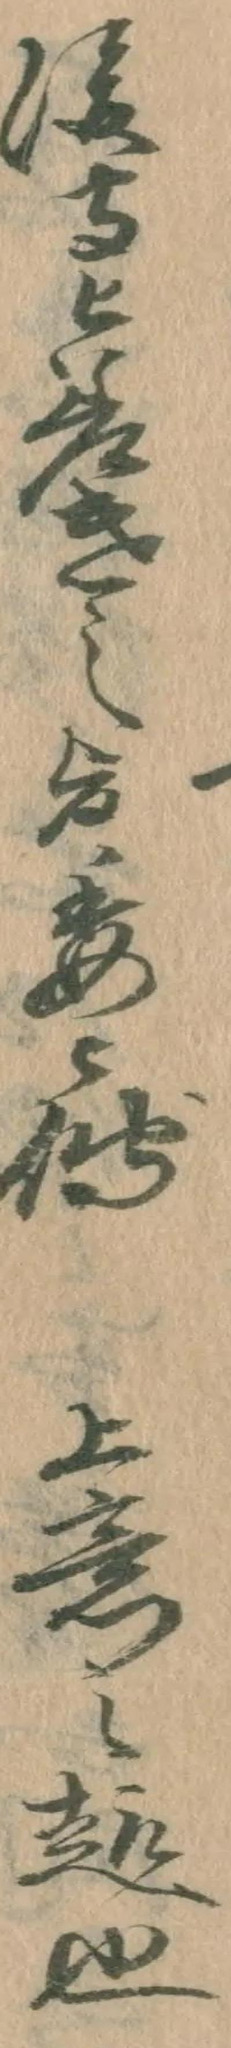後守被差遣之旨委被伝上意之趣也
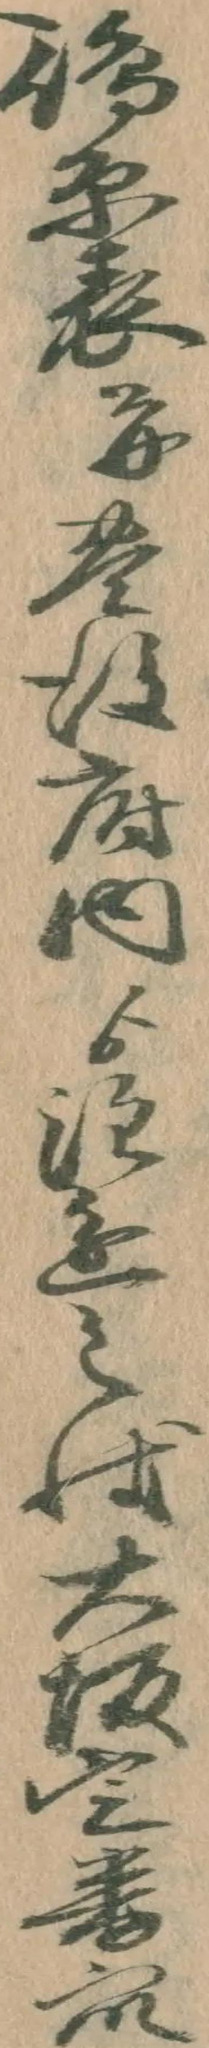島原表幷豊後府内ゟ注進之状大阪定番衆
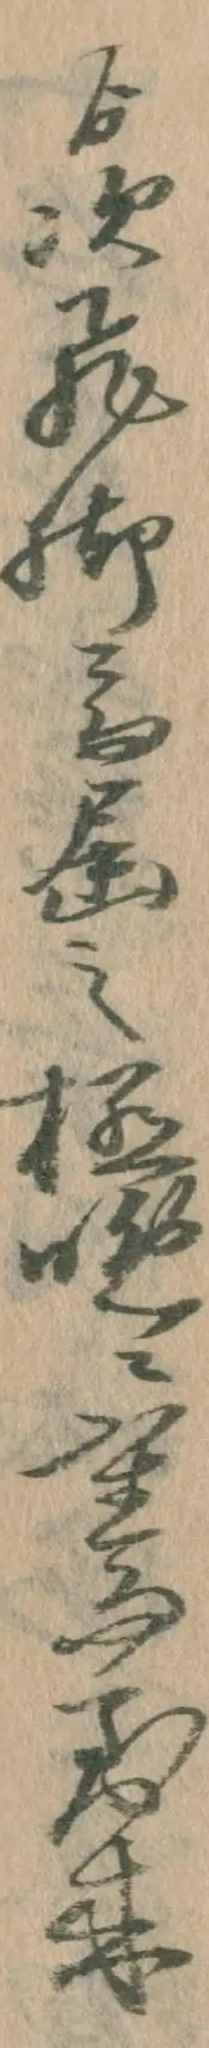ゟ次飛脚に而届之極晩に重而到来

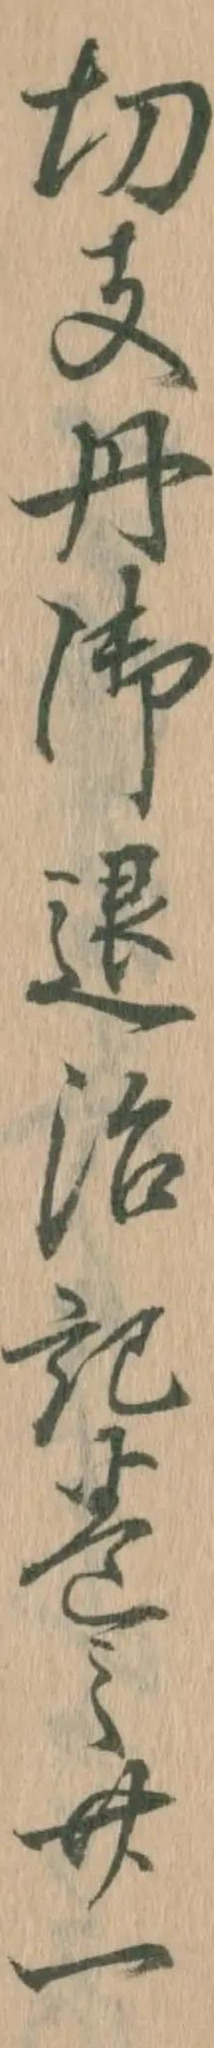切支丹御退治記巻之廿一
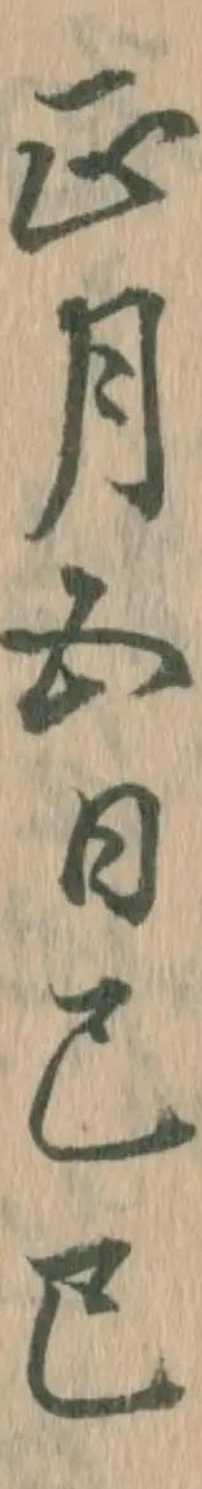正月五日乙巳
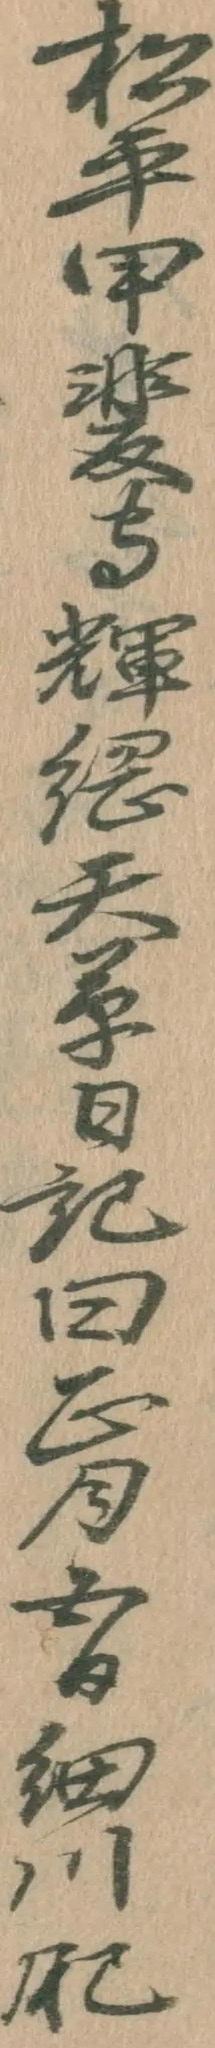松平甲斐守輝綱天草日記曰正月五日細川肥
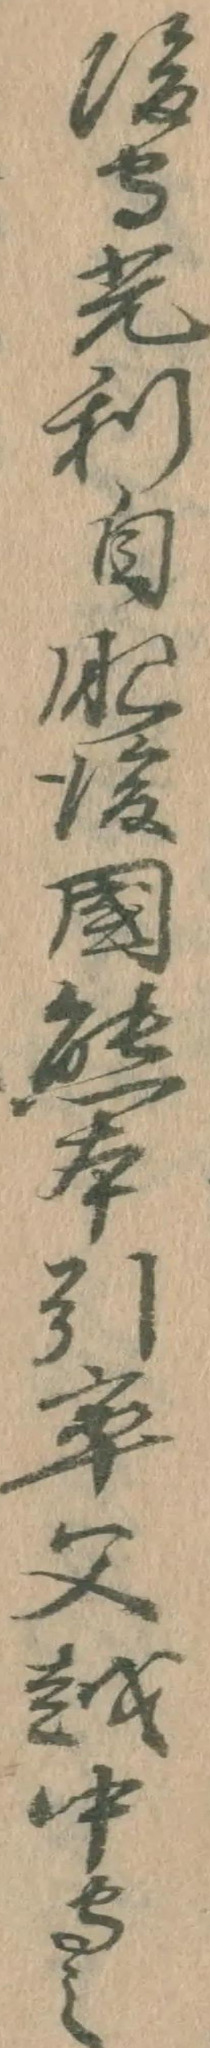後守光利自肥後国熊本引卒父越中守之
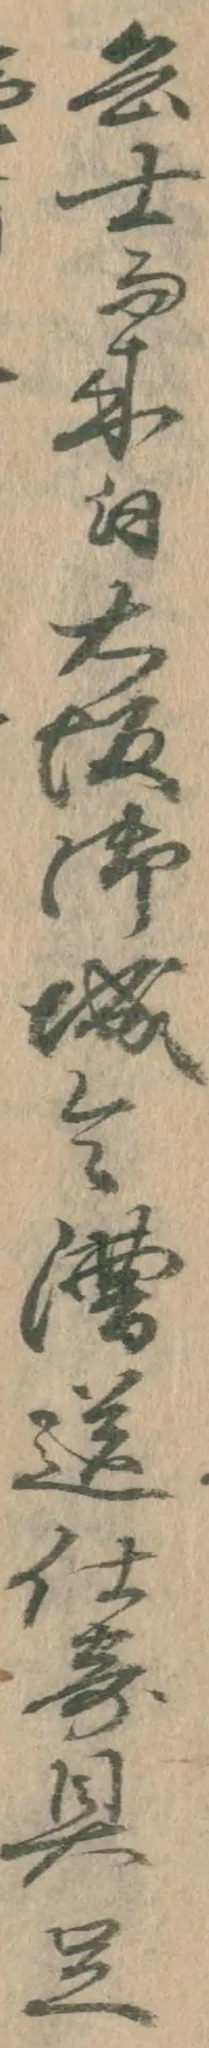兵士而来自大阪御城令漕送仕寄具足
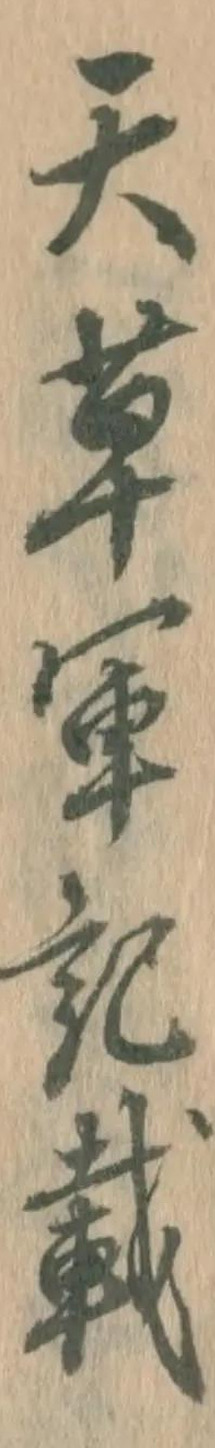天草軍記載
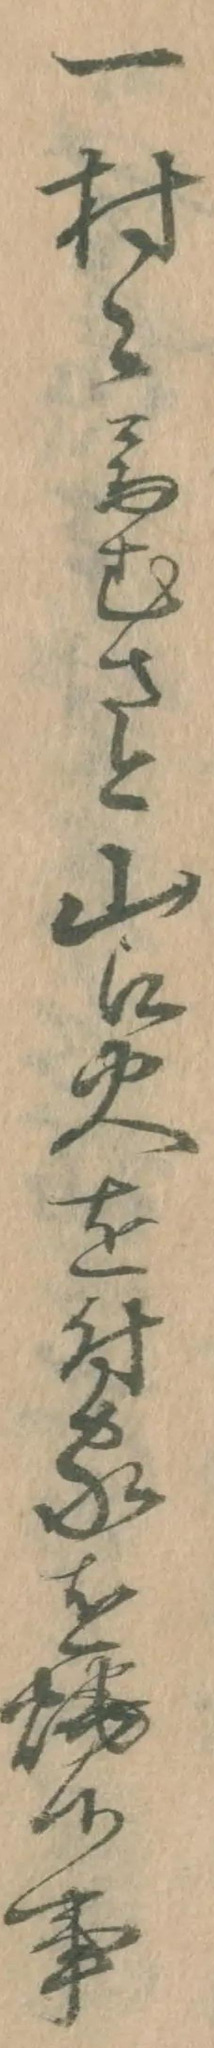一村々に而むさと山江火を付家を焼候事
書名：切支丹御退治記 49巻. [5]
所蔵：国立国会図書館 National Diet Library, JAPAN
